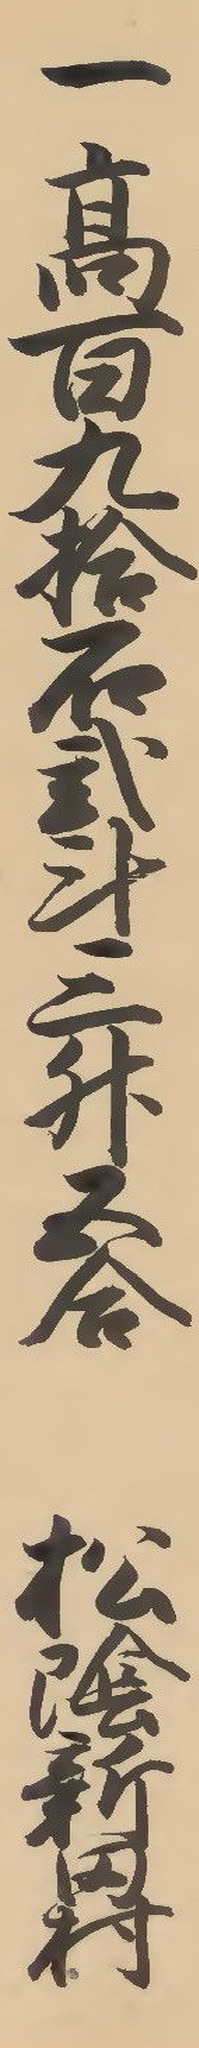一髙百九拾石弐斗三升五合松陰新田村
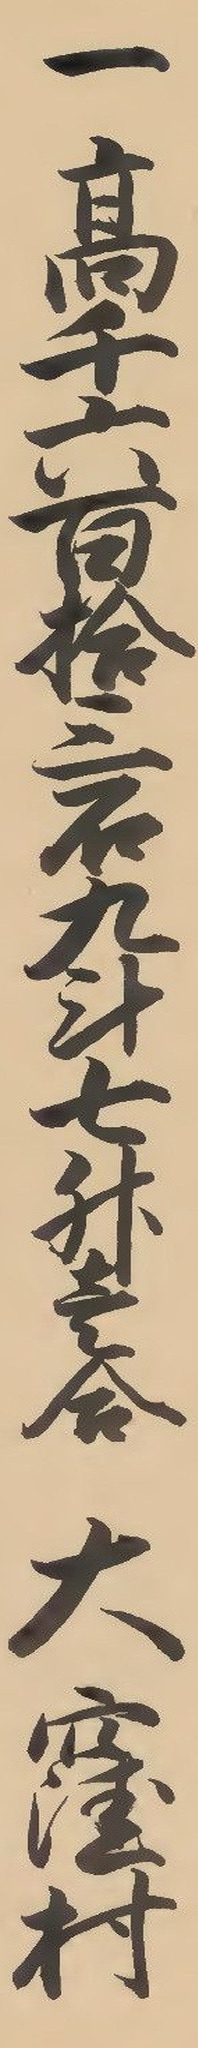一髙千六百拾三石九斗七升壱合大窪村
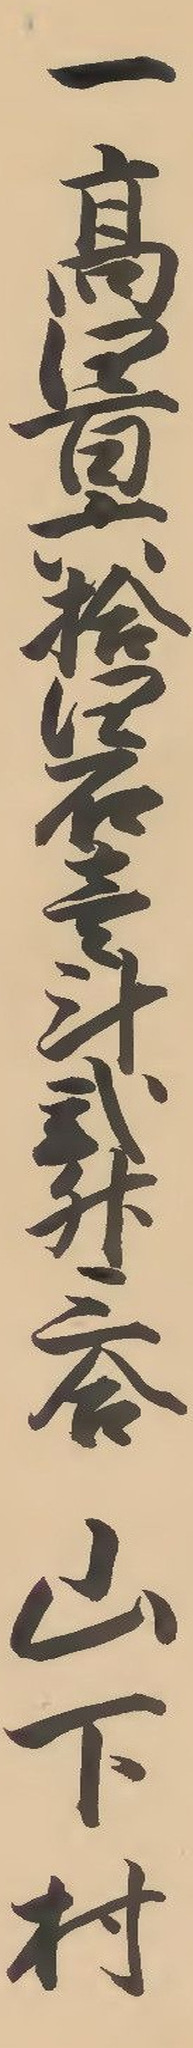一髙四百六拾四石壱斗弐升三合山下村
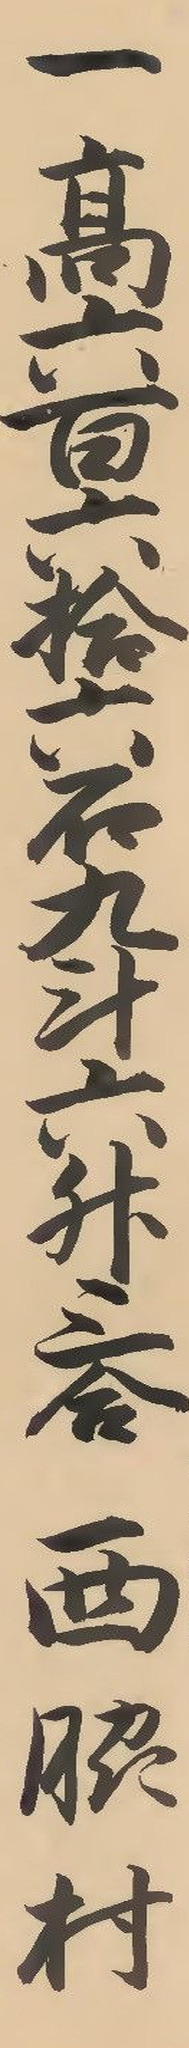一髙六百六拾六石九斗六升三合西脇村
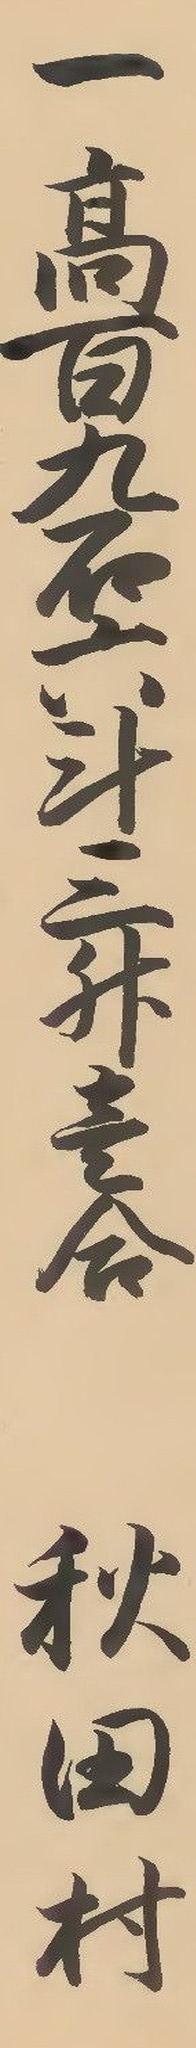一髙百九石六斗三升壱合秋田村
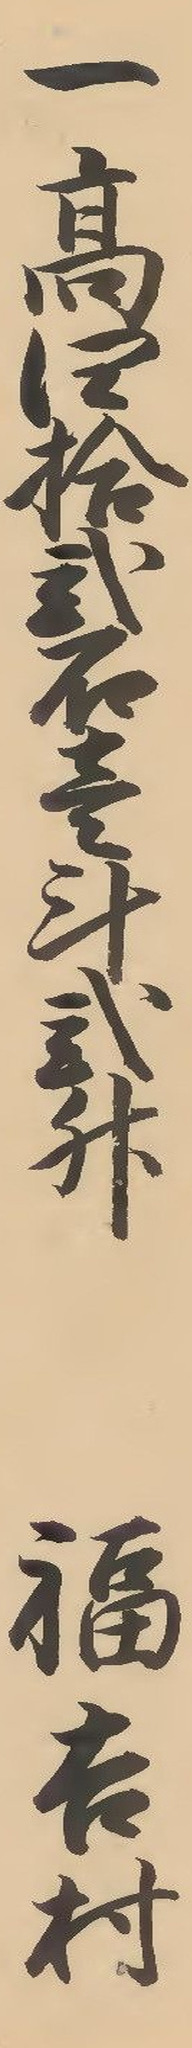一髙四拾弐石壱斗弐升福吉村
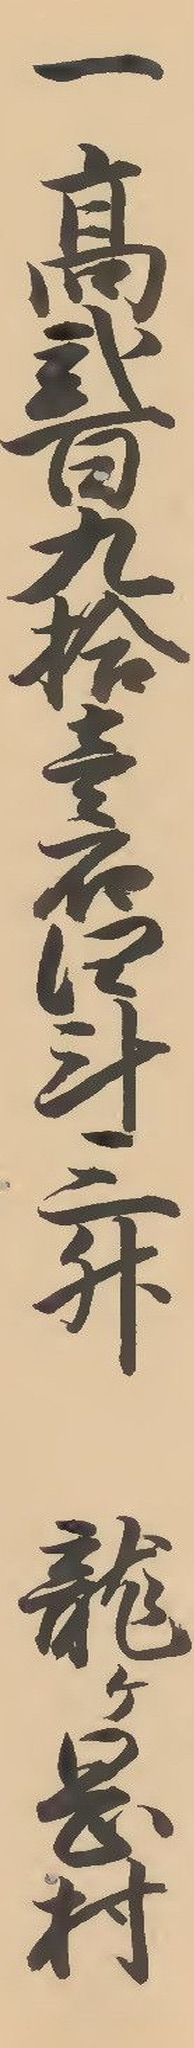一髙弐百九拾壱石四斗三升龍ケ岡村

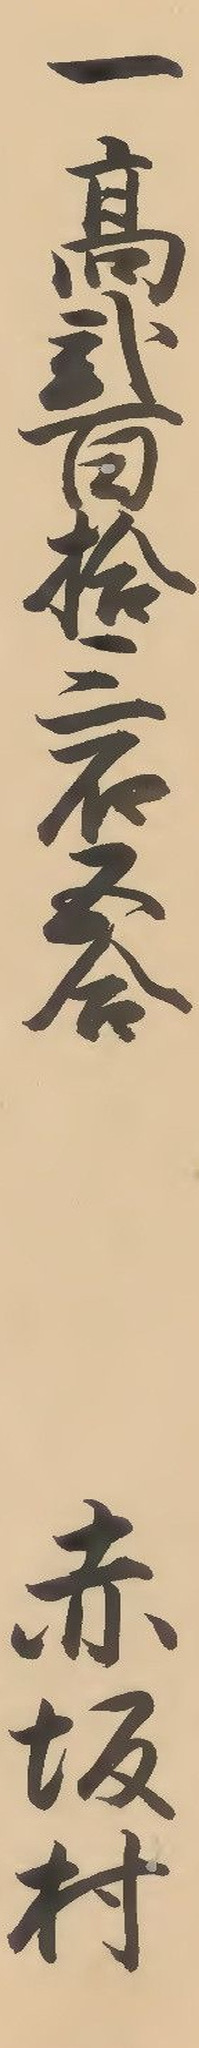一髙弐百拾三石五合赤坂村
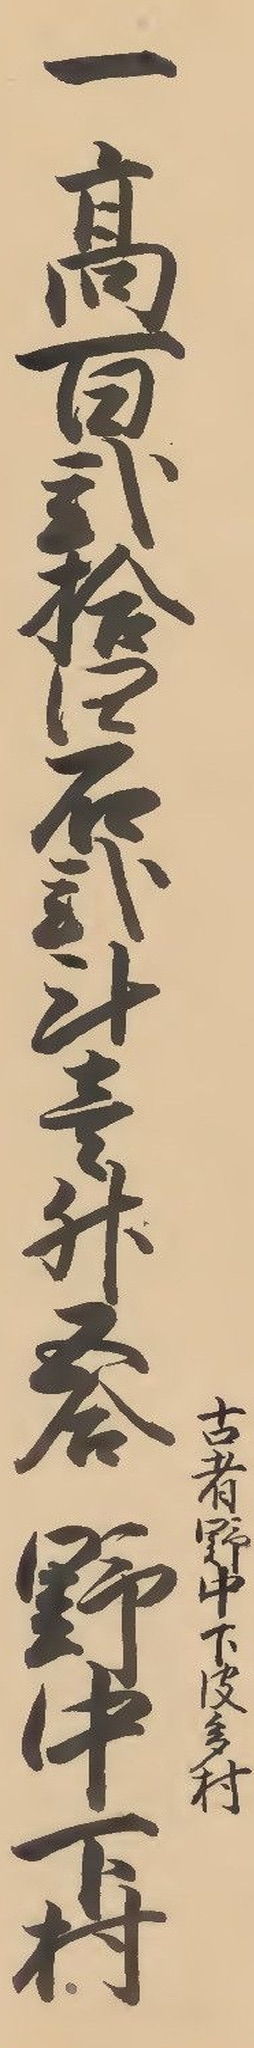一髙百弐拾四石弐斗壱升五合野中下村
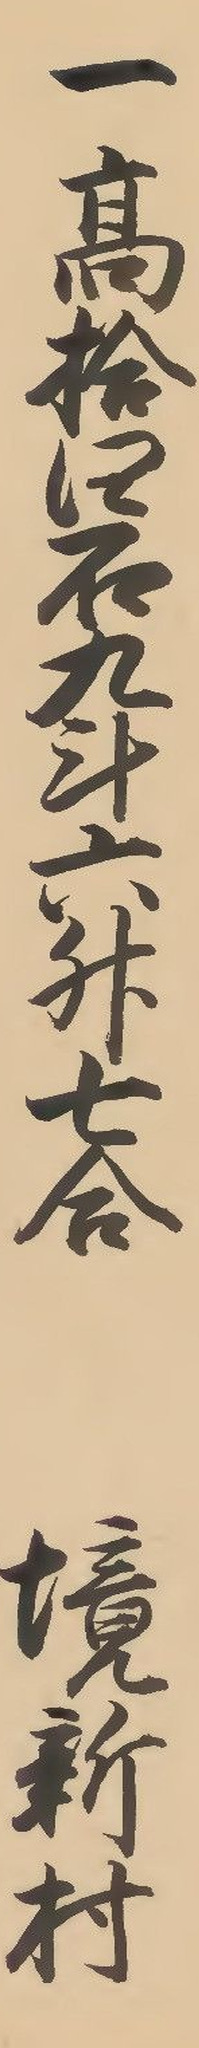一髙拾四石九斗六升七合境新村
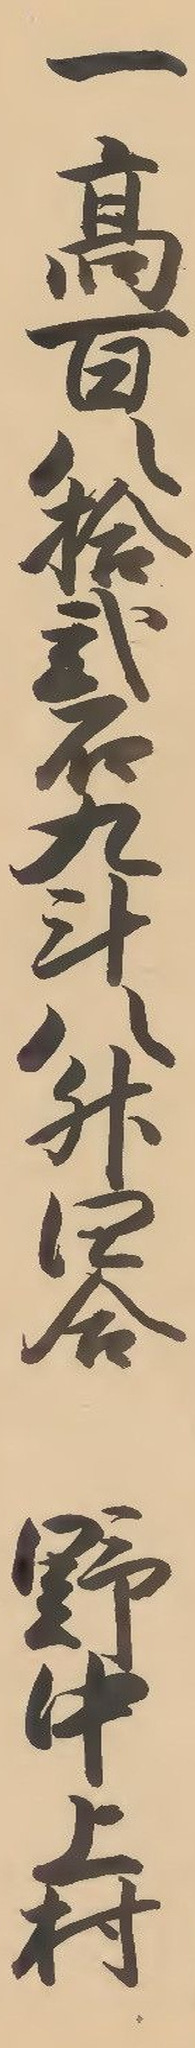一髙百八拾弐石九斗八升四合野中上村
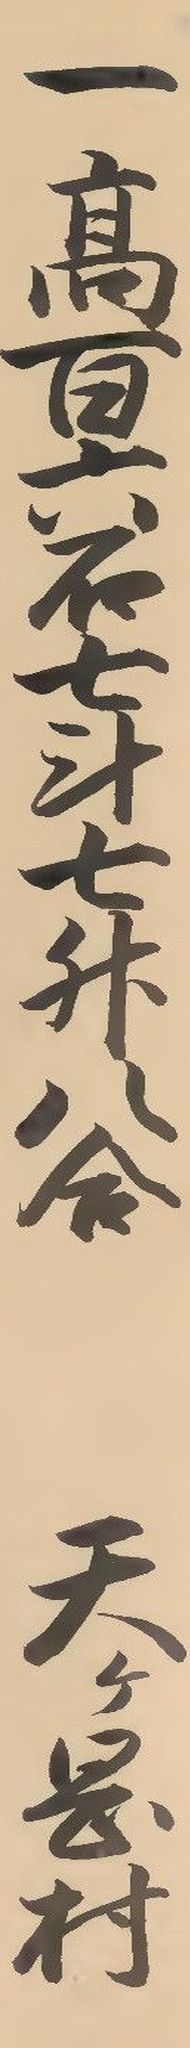一髙百六石七斗七升八合天ケ岡村
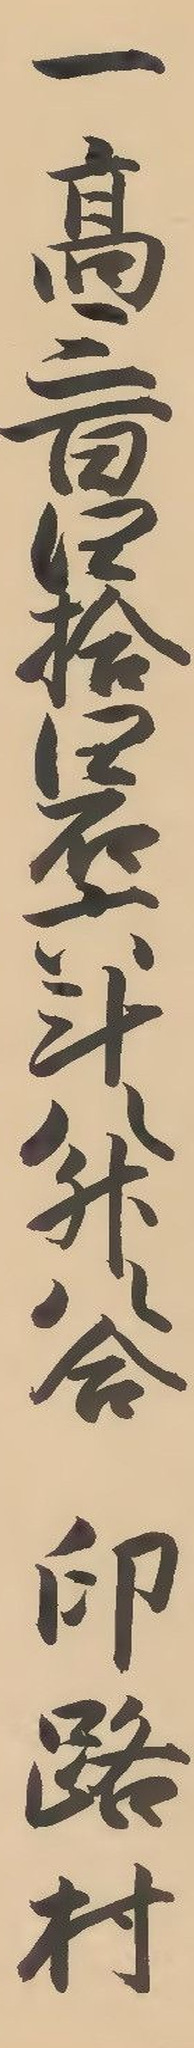一髙三百四拾四石六斗八升八合印路村
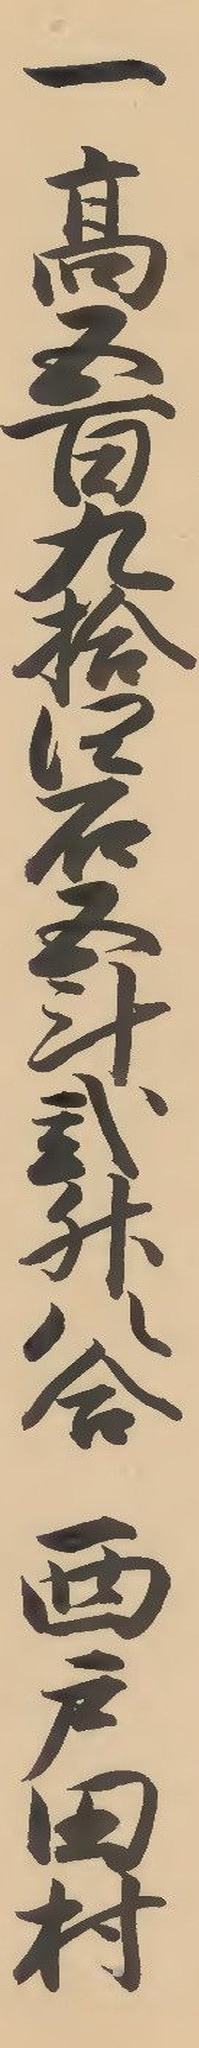一髙五百九拾四石五斗弐升八合西戸田村
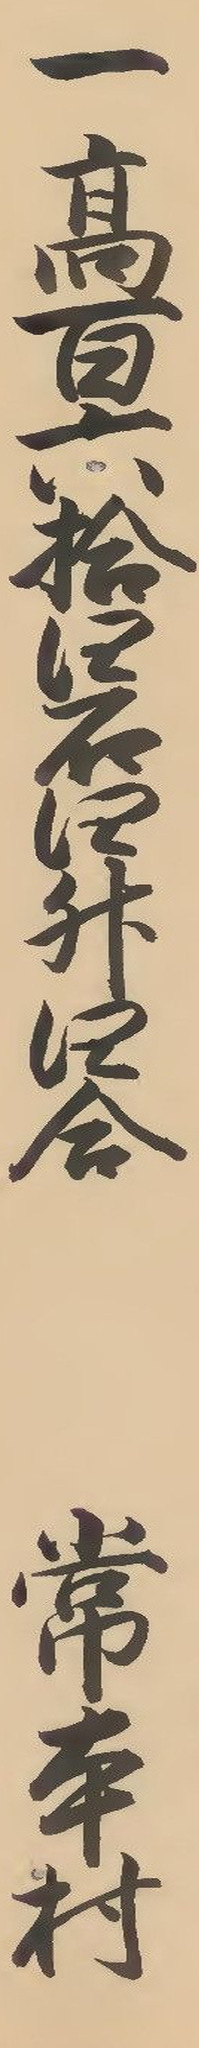一髙百六拾四石四升四合常本村

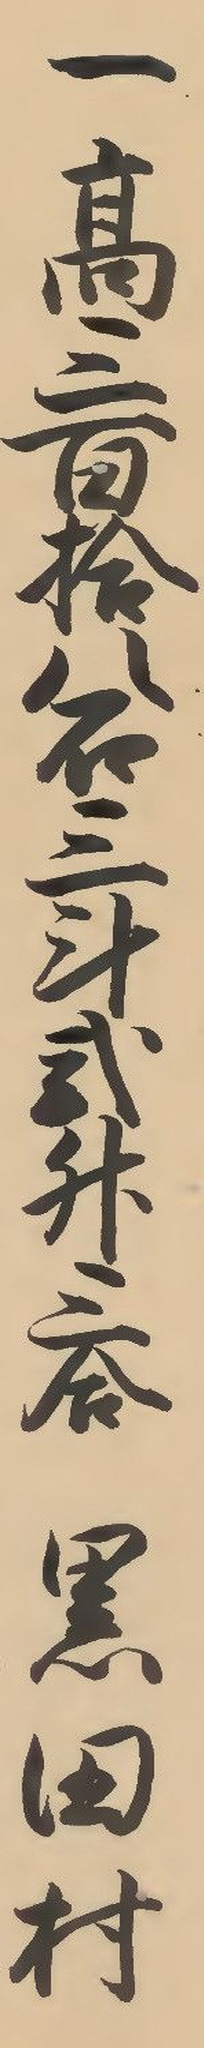一髙三百拾八石三斗弐升三合黑田村
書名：播磨国郷帳
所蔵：国立公文書館 National Archives of Japan
